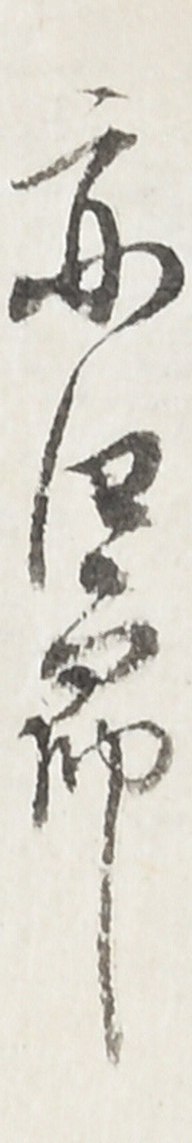亦四郎
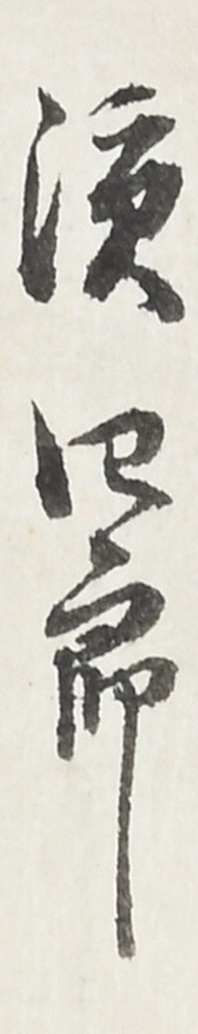浜四郎
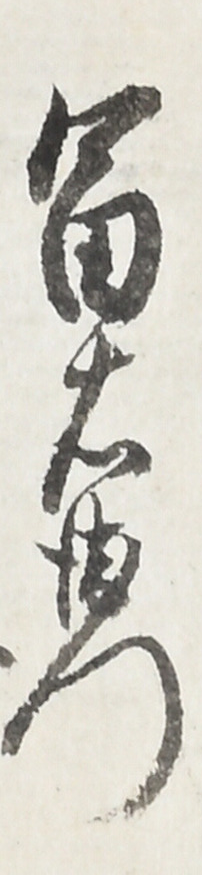冨右衛門
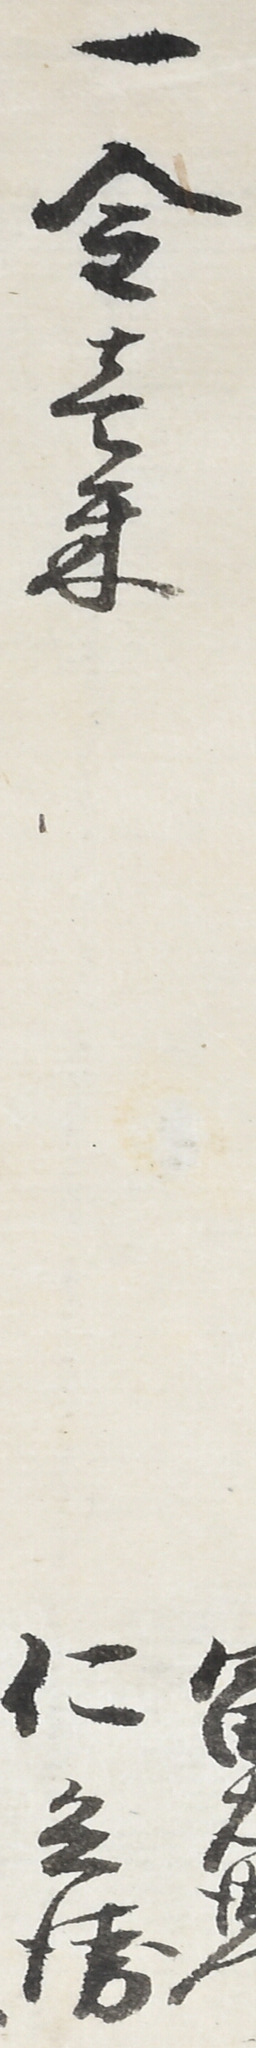一金壱朱仁兵衛
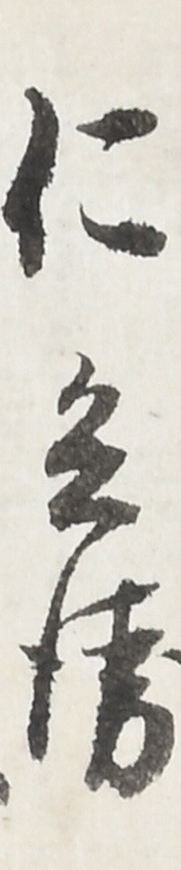弥兵衛
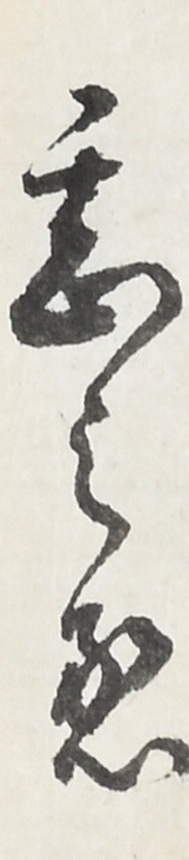甚之丞

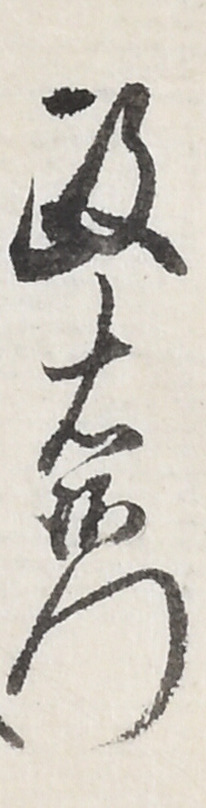政右衛門
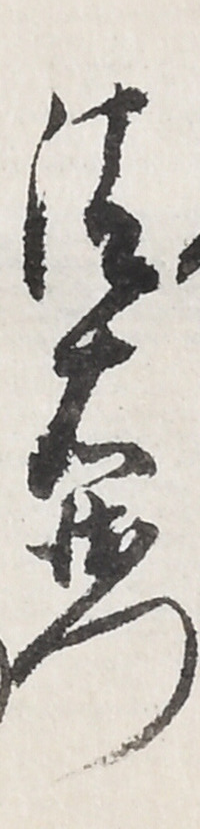清右衛門
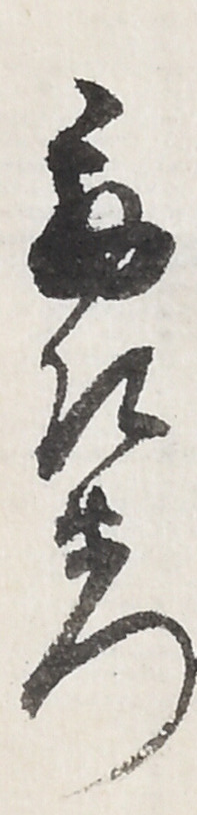甚左衛門
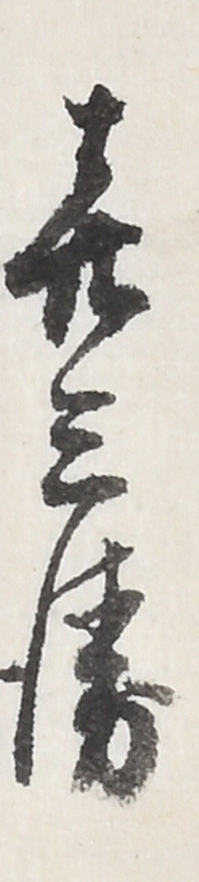喜兵衛
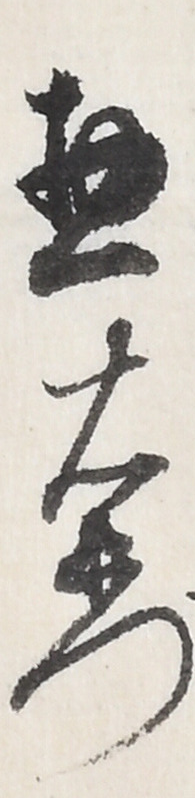惣右衛門
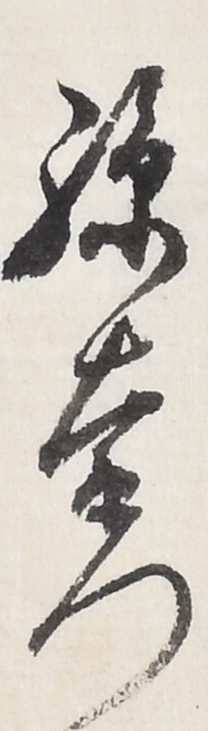孫右衛門
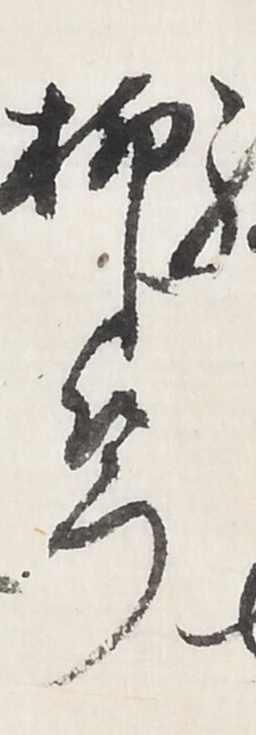柳左衛門
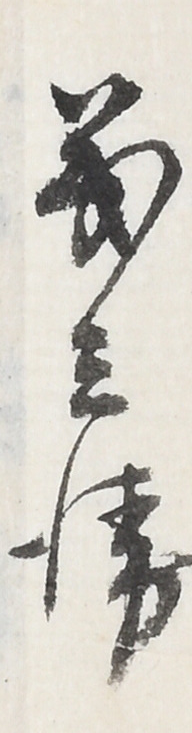喜兵衛
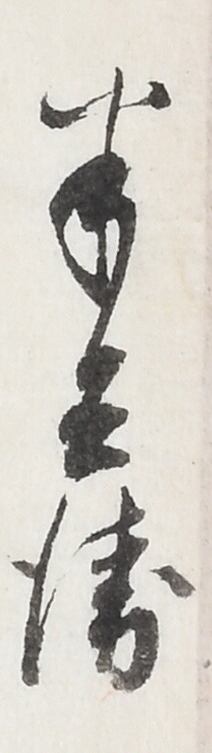半兵衛
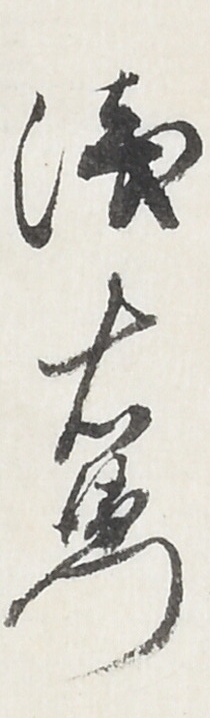浅右衛門
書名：御拝地百五拾年御祝儀献上御目録名前
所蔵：伊那市立高遠町図書館・合同会社AMANE
